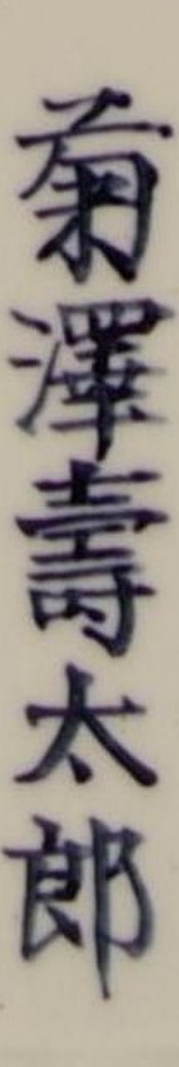菊澤壽太郎
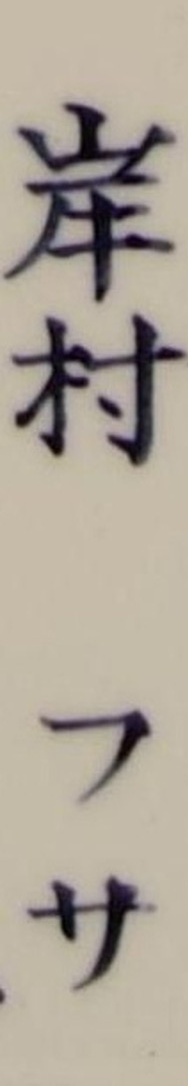岸村フサ
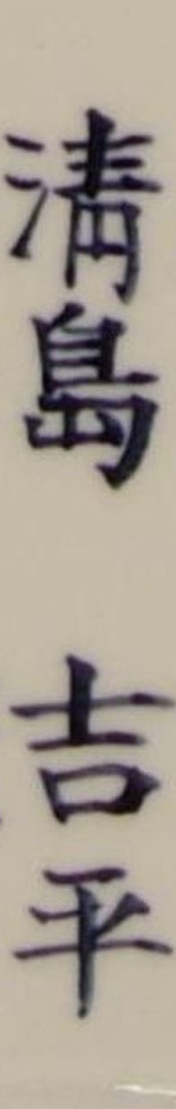清島吉平
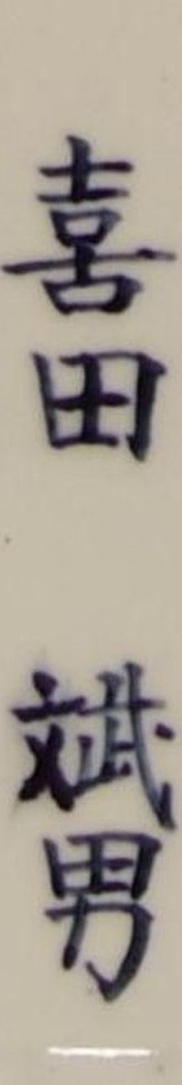喜田斌男
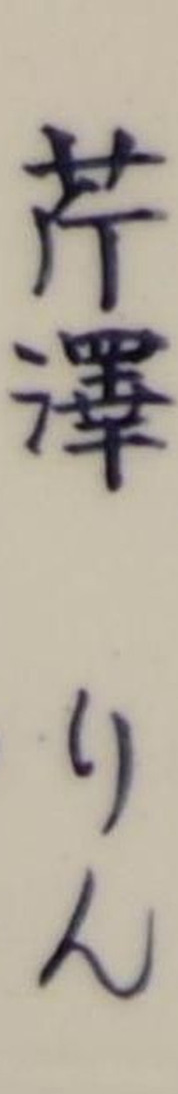芹澤りん
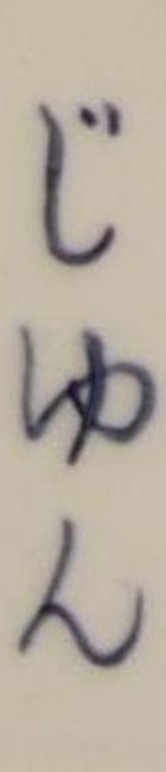じゆん
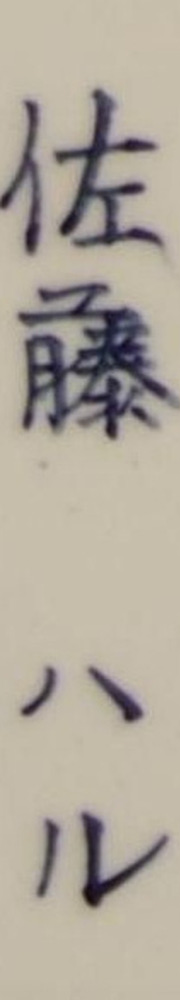佐藤ハル
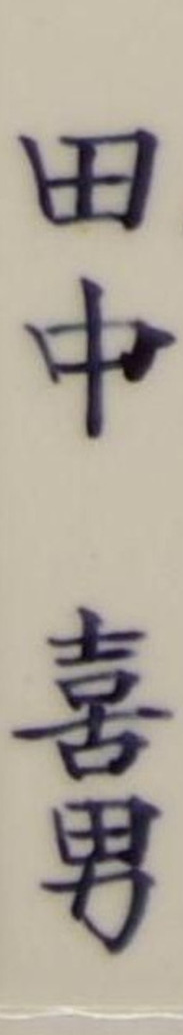田中喜男

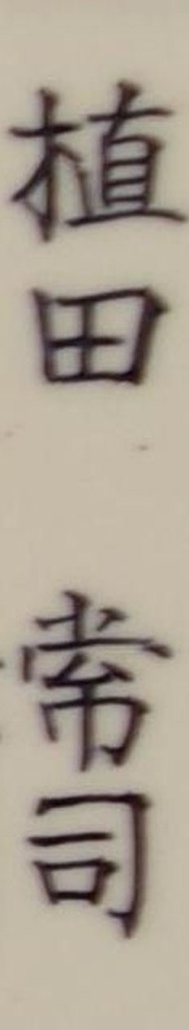植田常司
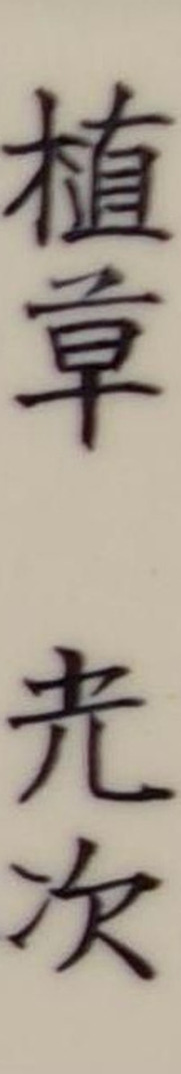植草光次
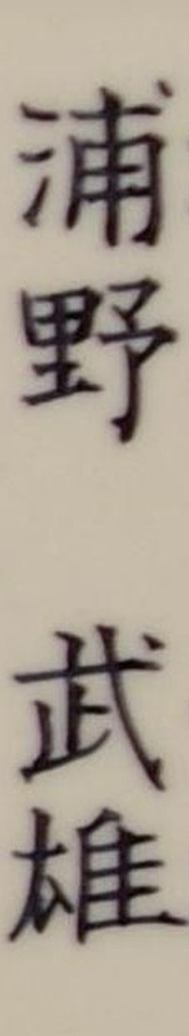浦野武雄
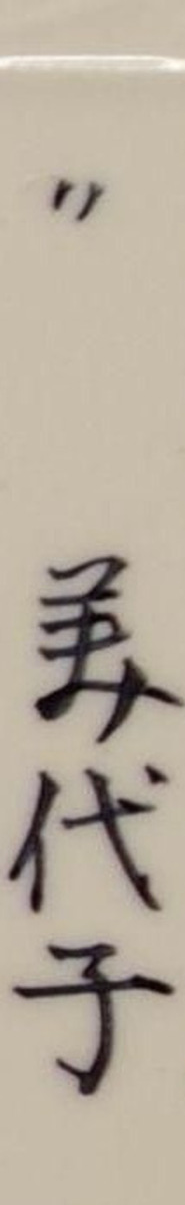美代子
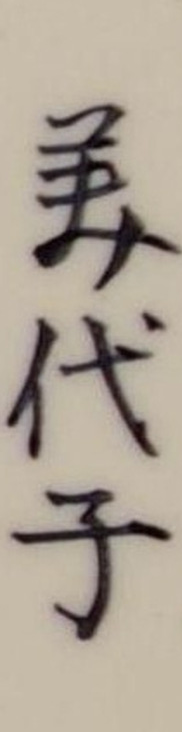美代子
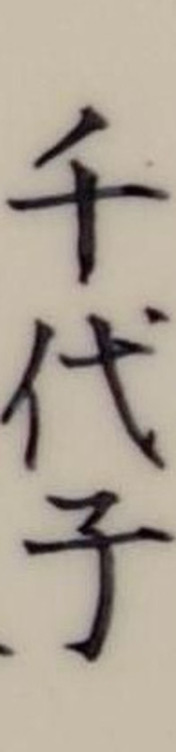千代子
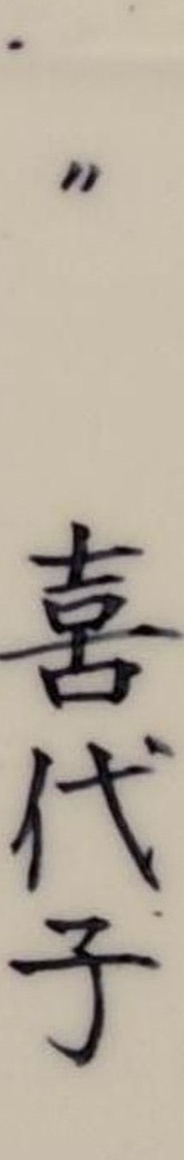喜代子
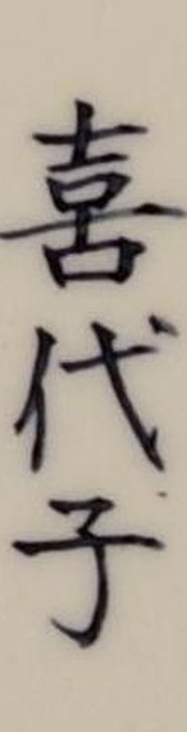喜代子
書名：E~L
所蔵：高野山金剛峯寺
